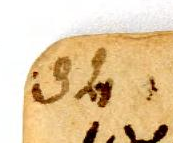34
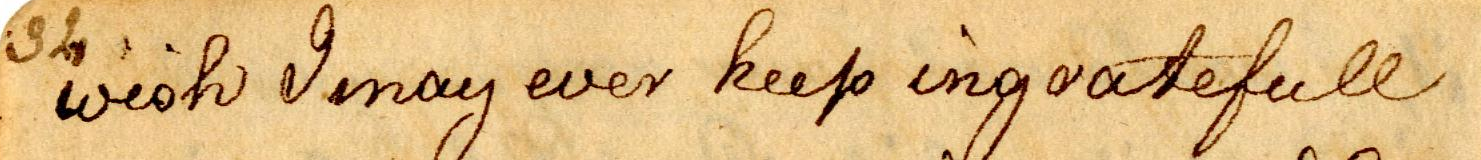wish I may ever keep ingratefull
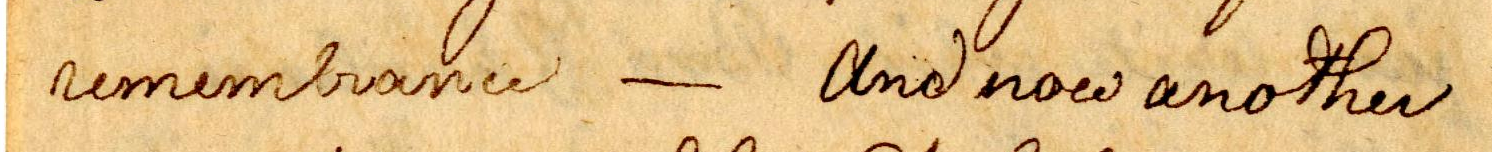remembrance- And now another
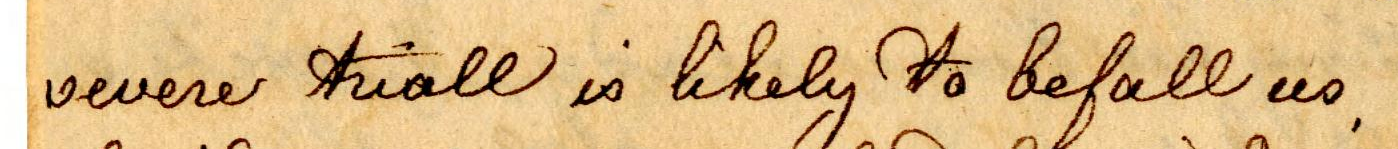severe triall is likely to befall us,
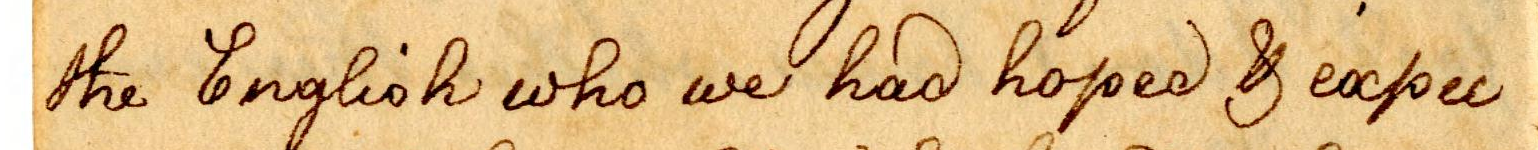the English who we had hoped & expec
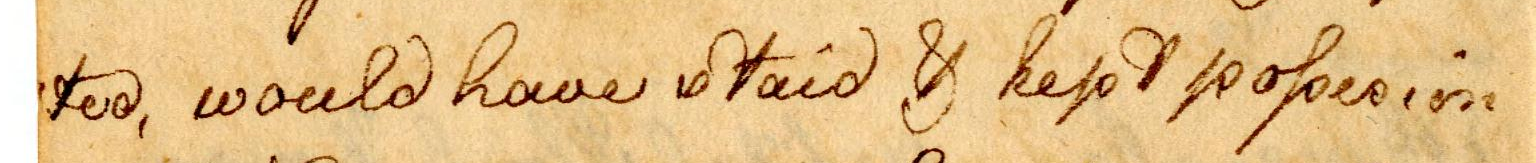-ted, would have staid & kept possesion
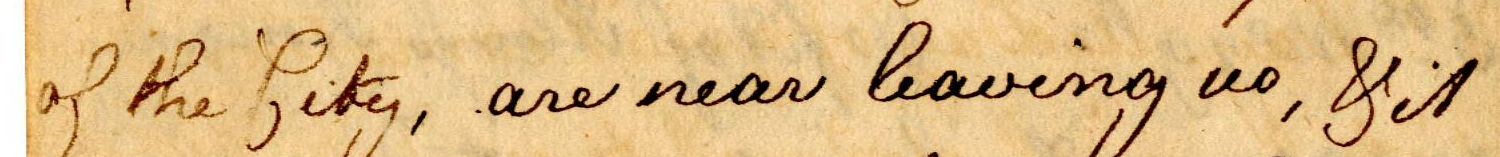of the City, are near leaving us, & it
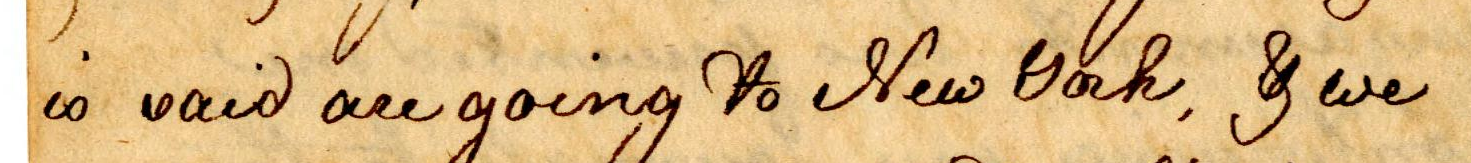is said are going to New York, & we
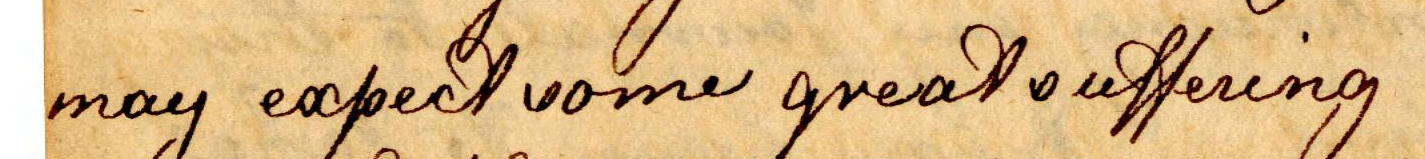may expect some great suffering
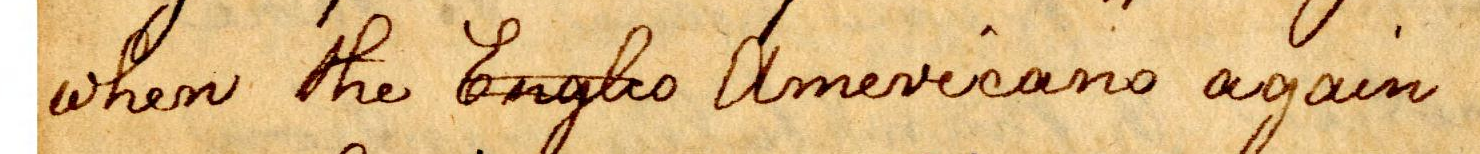when the Englis Americans again
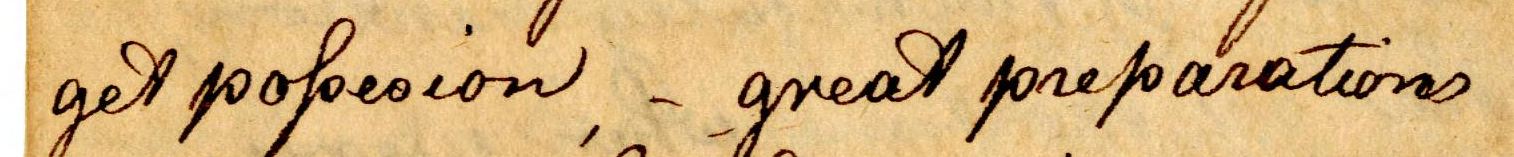get possesion,- great preparations
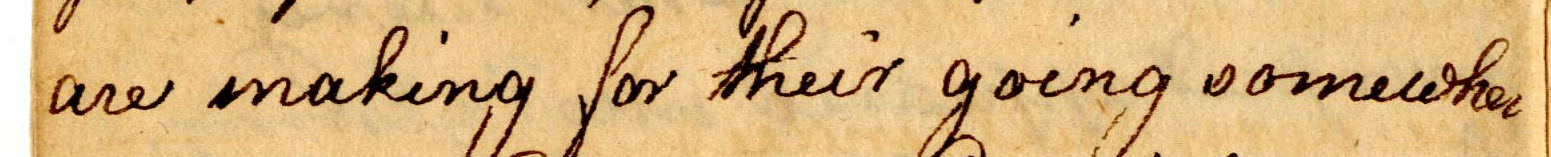are making for their going somewhere
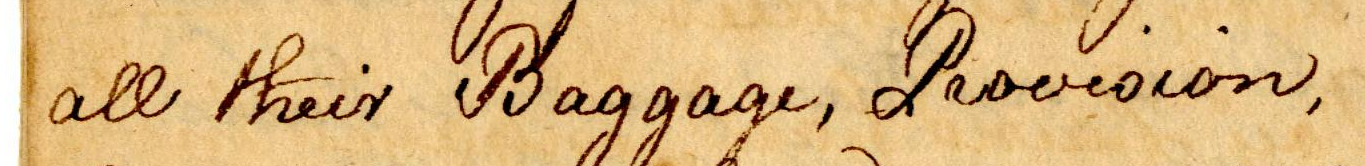all their Baggage, Provision,
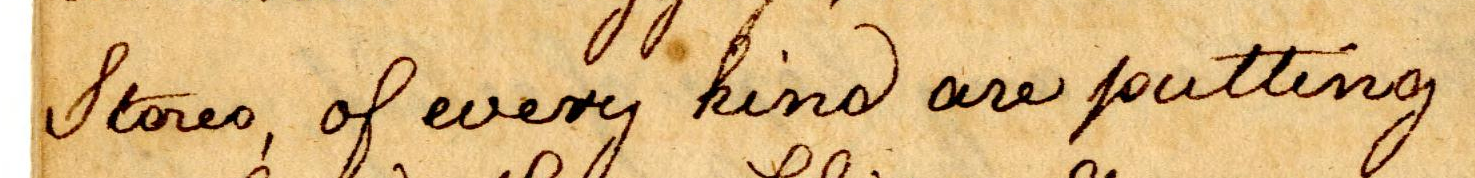Stores, of every kind are putting
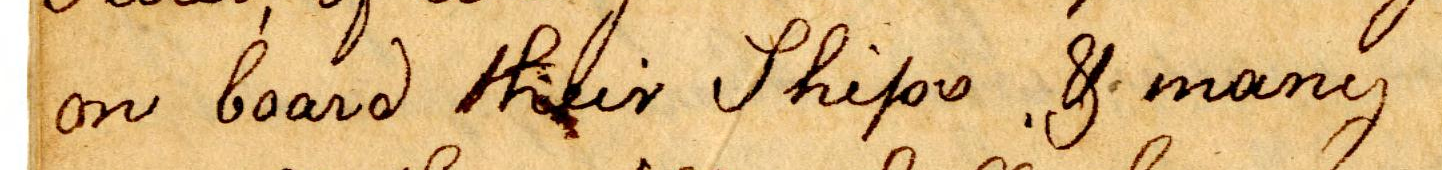on board their Ships & many
